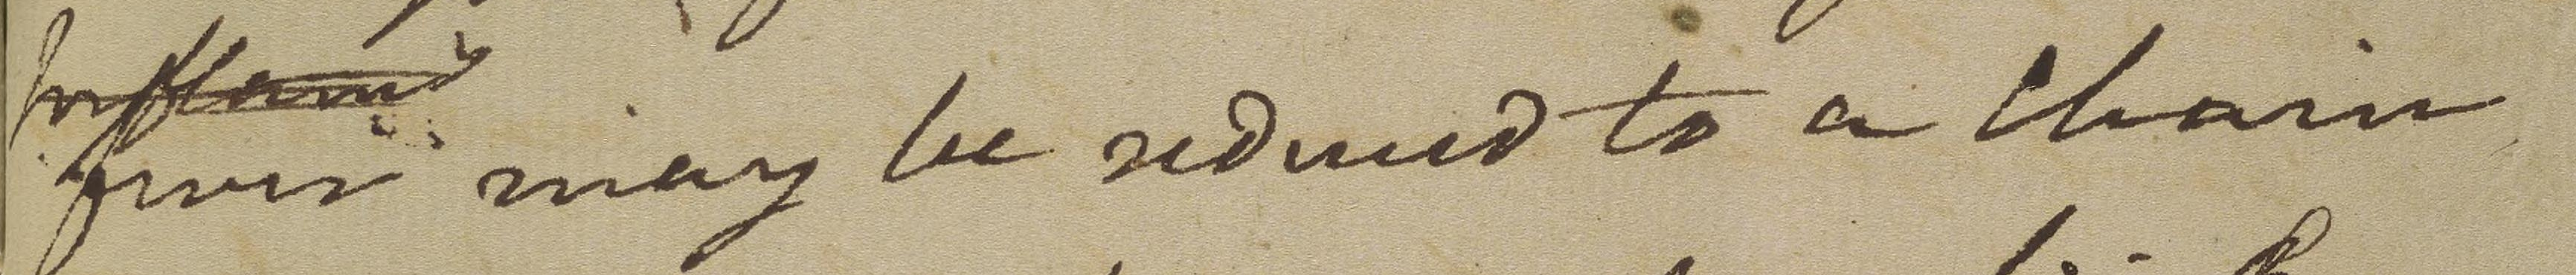fever may be reduced to a claim
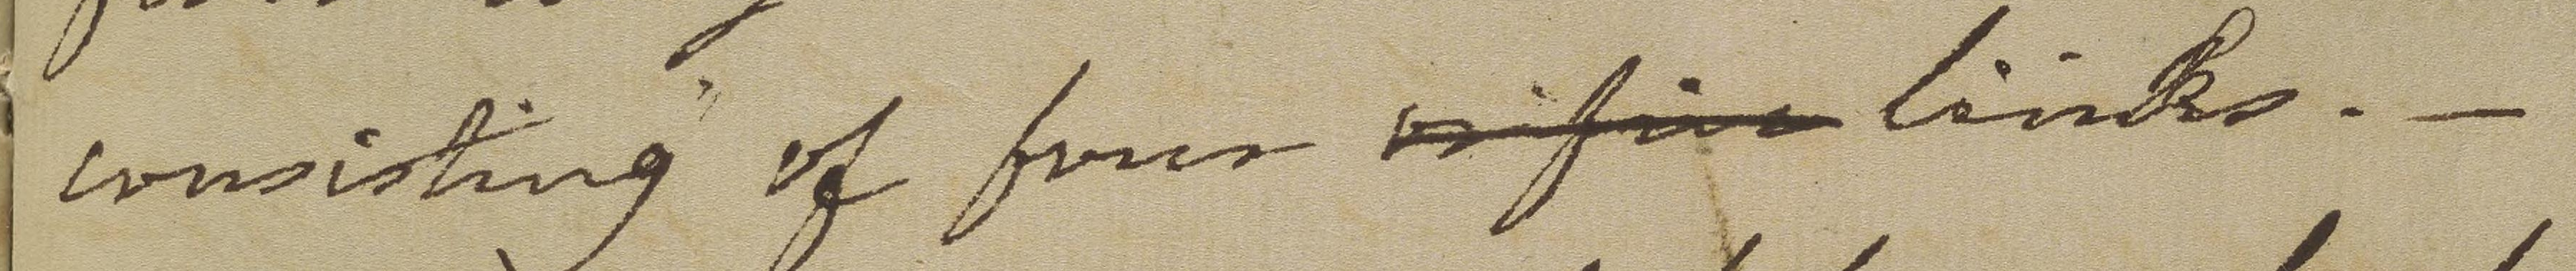consisting of fever [______] links.
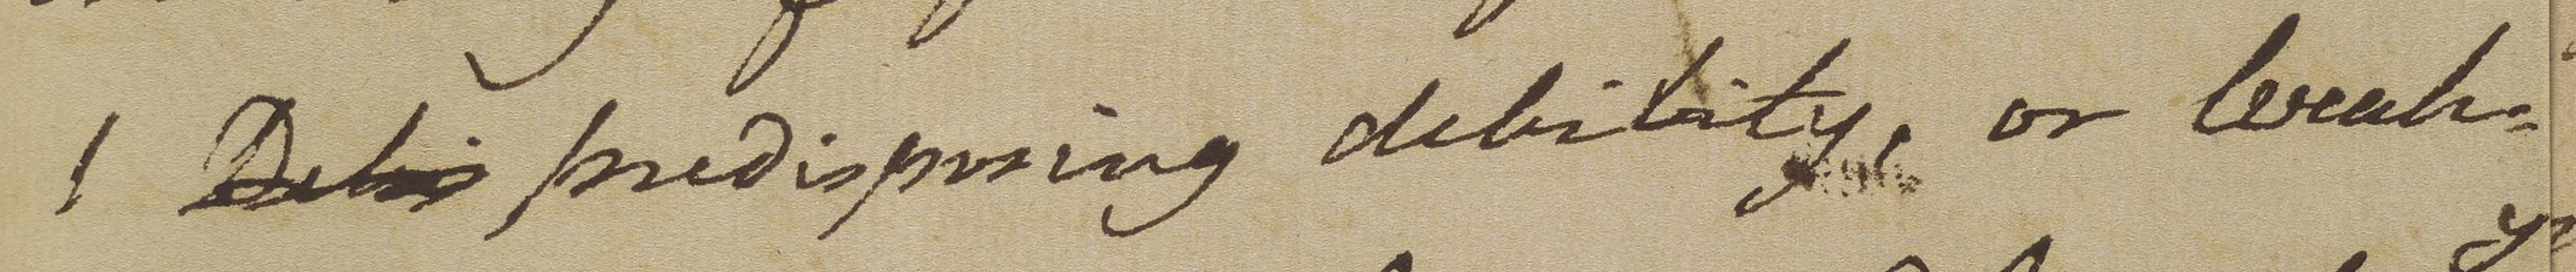1 [Debi] predisposing debility, or weak-
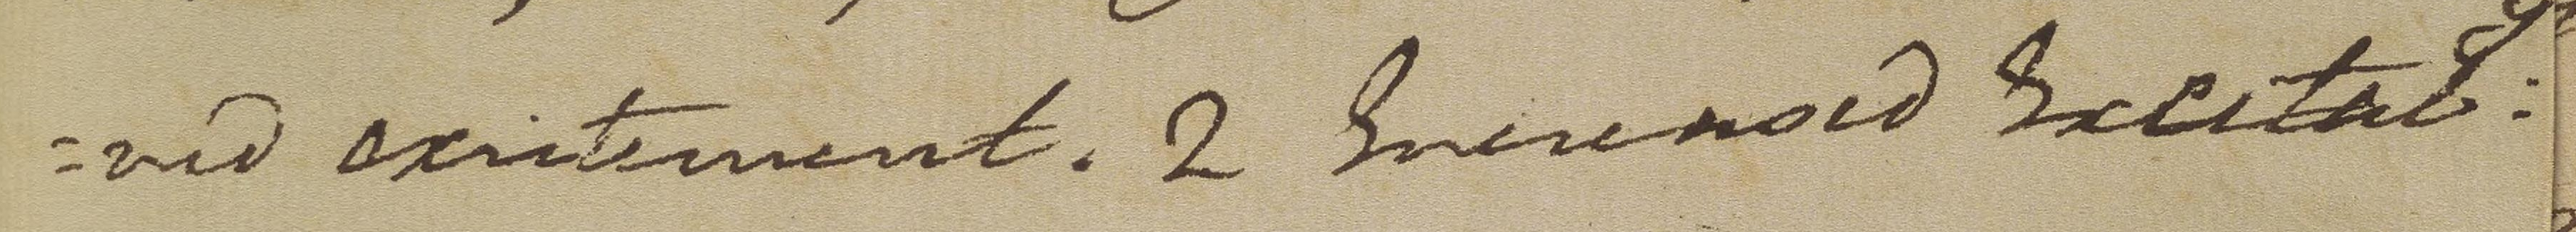-ened excitement? Encreased excital^y
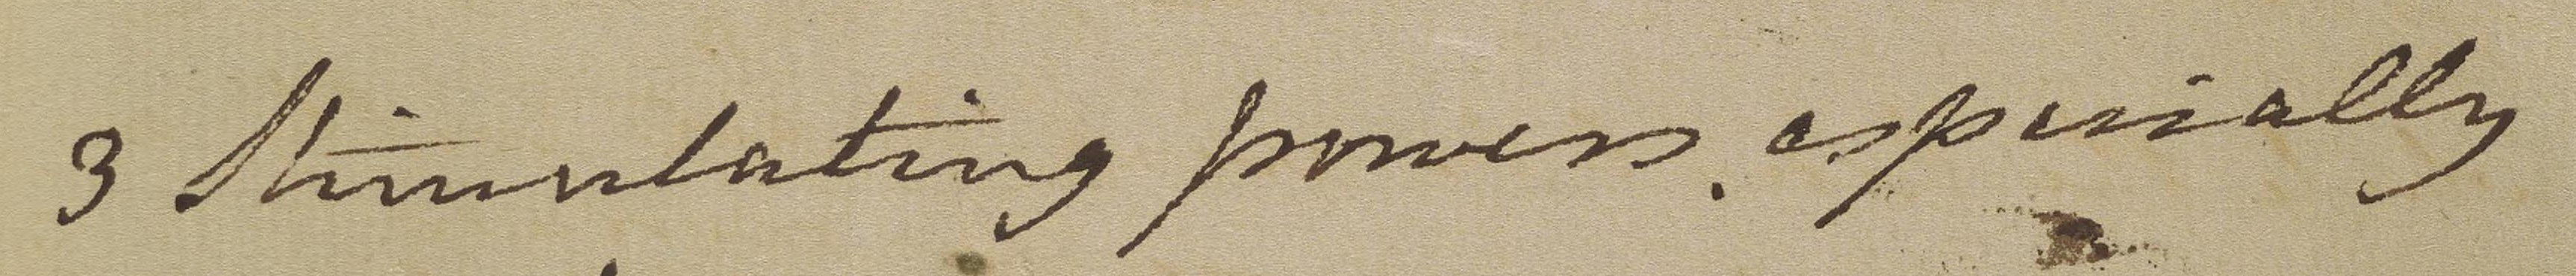3 Stimulating powers, especially
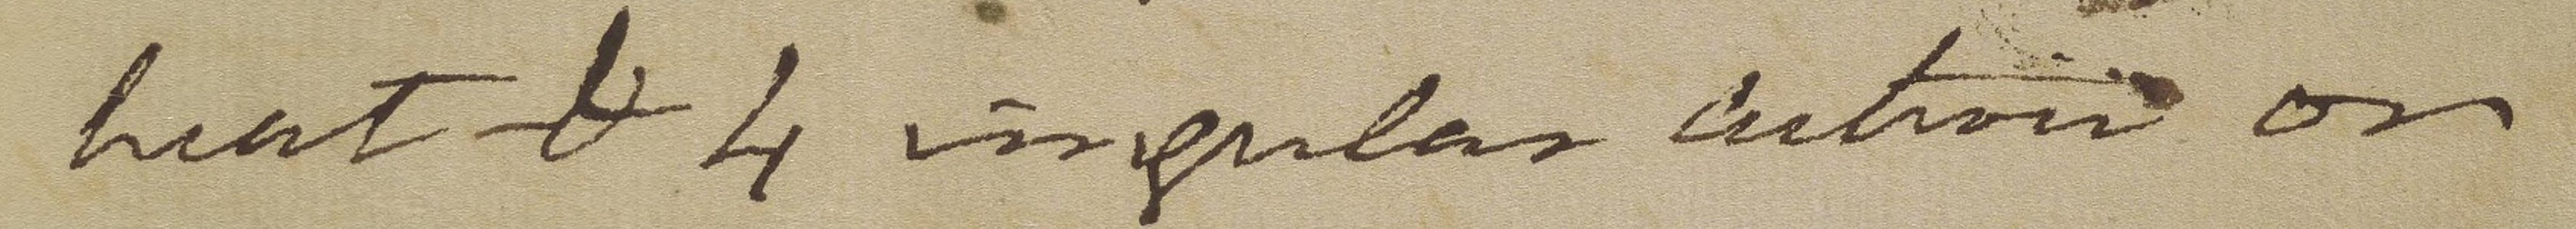heat & 4 irregular action on
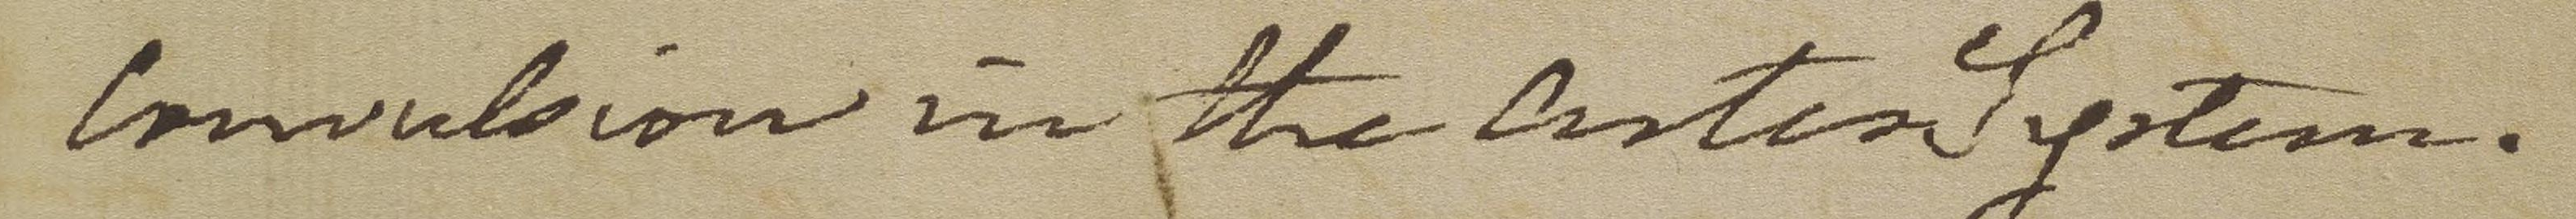convulsion in the arter^l system.
